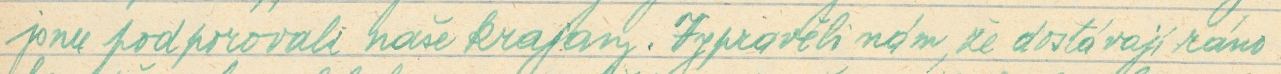jsme podporovali naše krajany. Vypravěli nám, že dostávají ráno
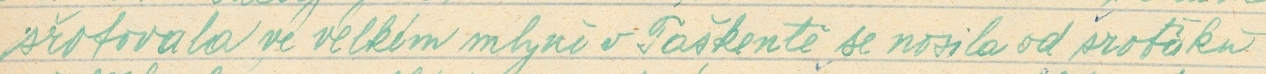šrotovala ve velkém mlyně v Taškentě se nosila od šroťáku
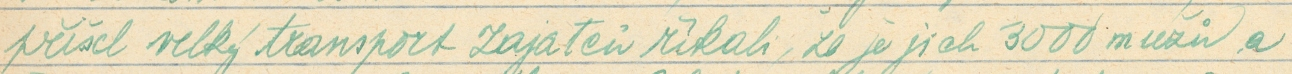přišel velký transport zajatců říkali, že je jich 3000 mužů a
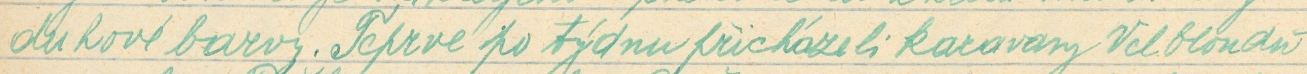duhové barvy. Teprve po týdnu přicházeli karavany Velbloudů
